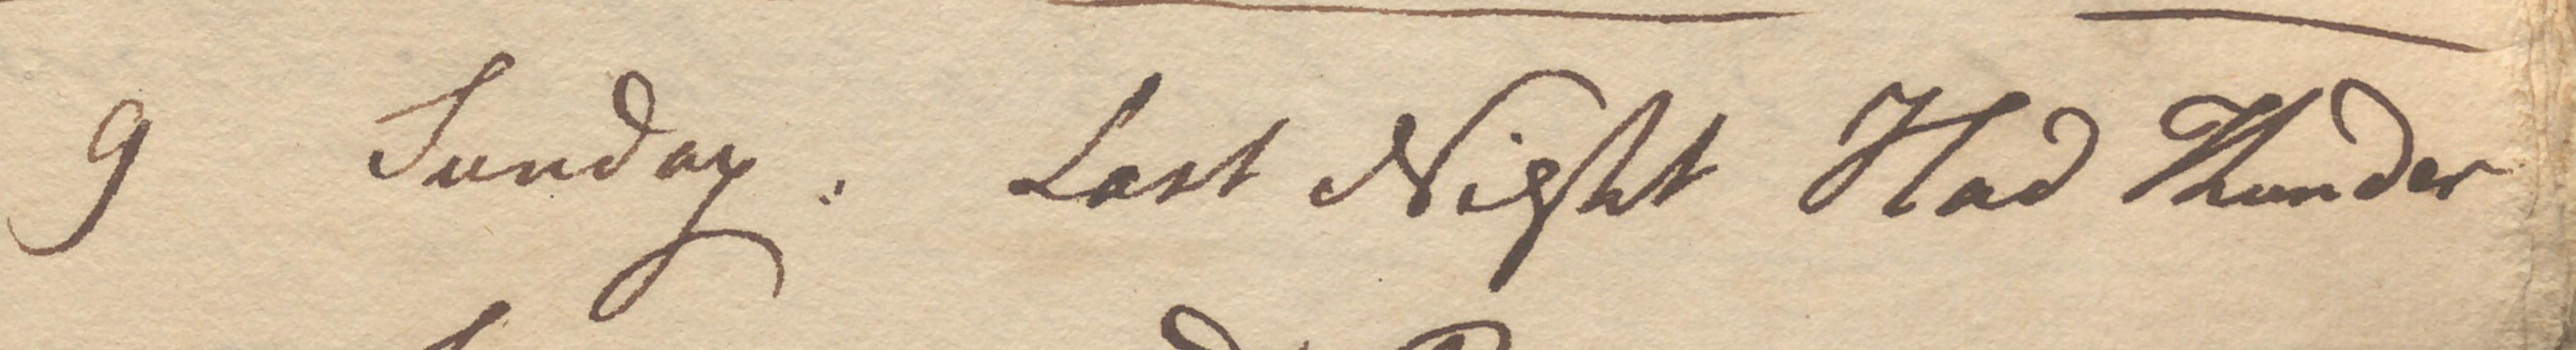9 Sunday. Last Night Had Thunder
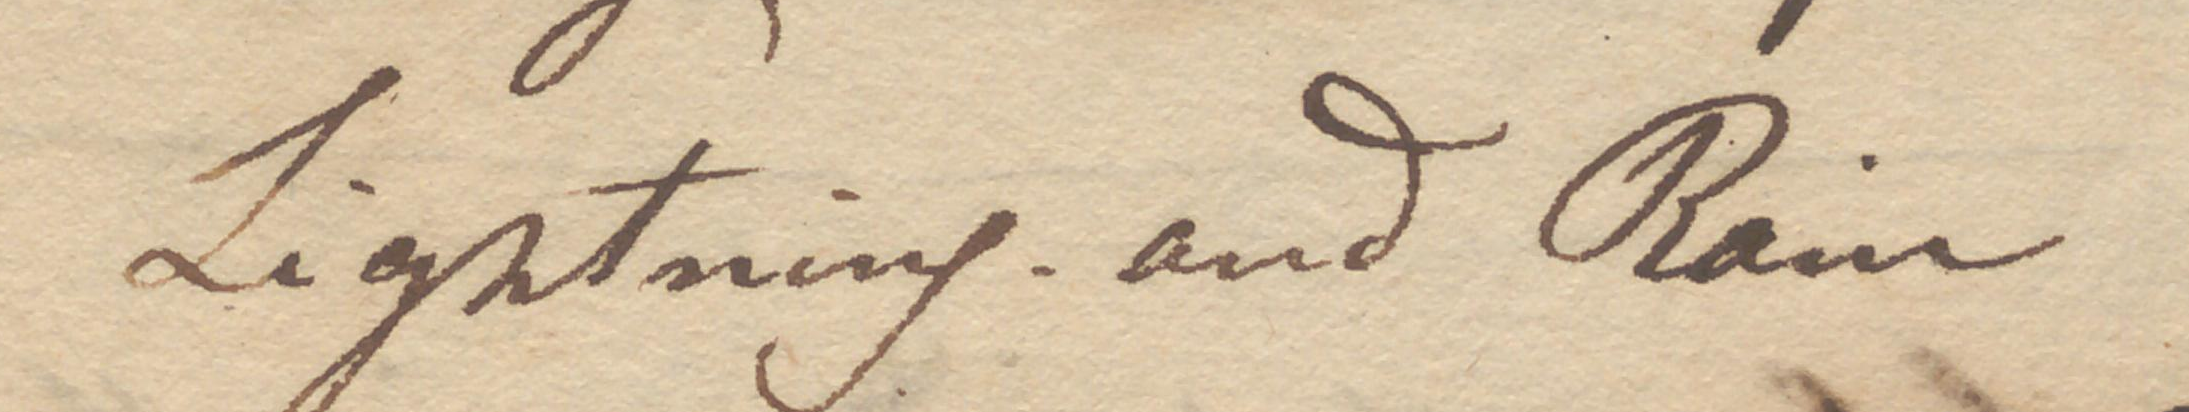Lightning. and Rain
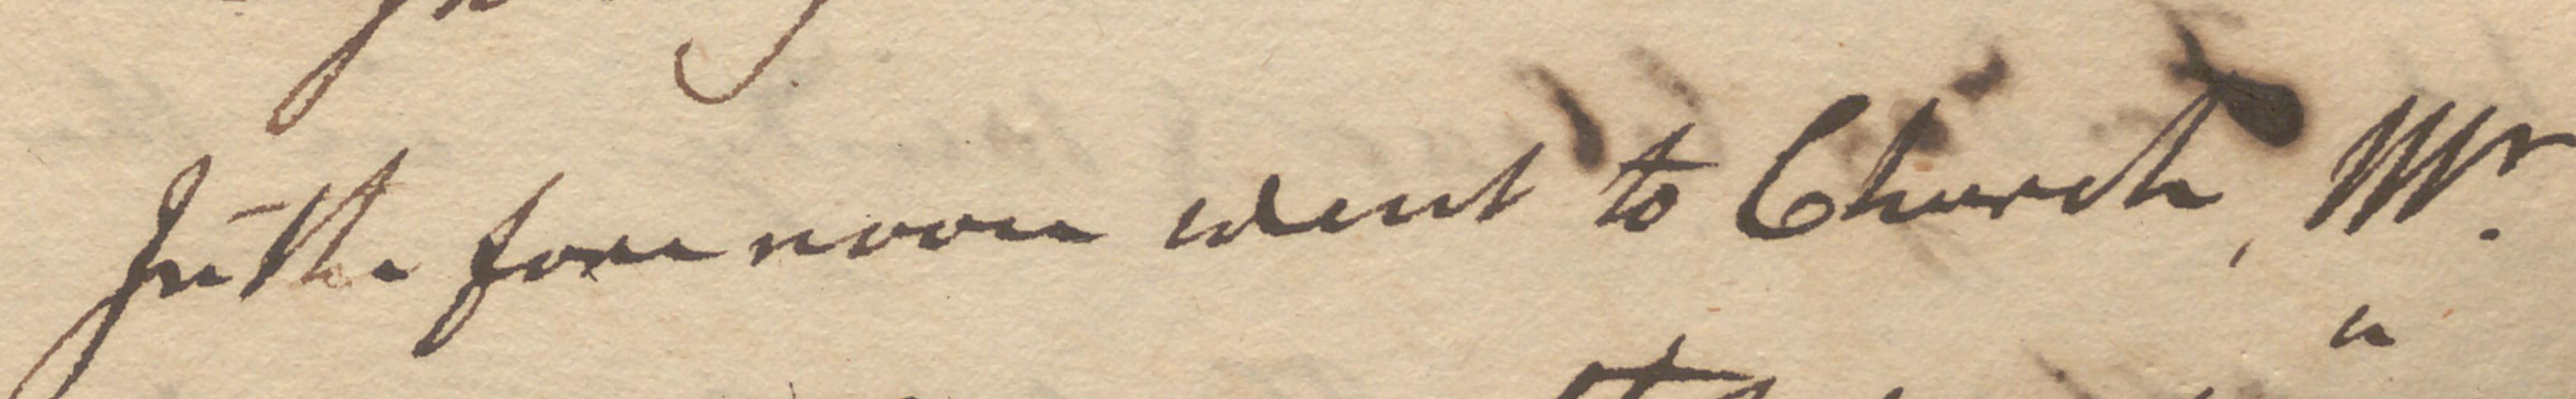Inthe forenoon went to Church M^r.
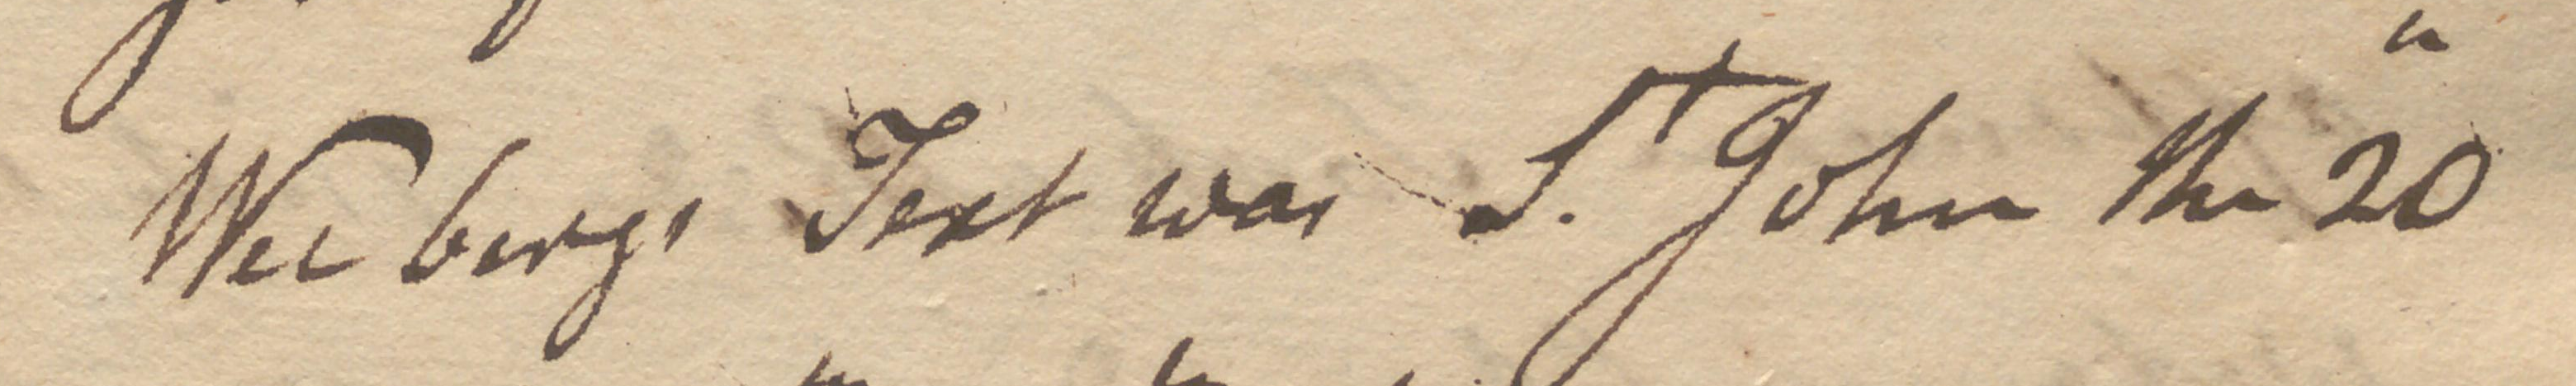Weibergs Text was S^t. John the 20th
